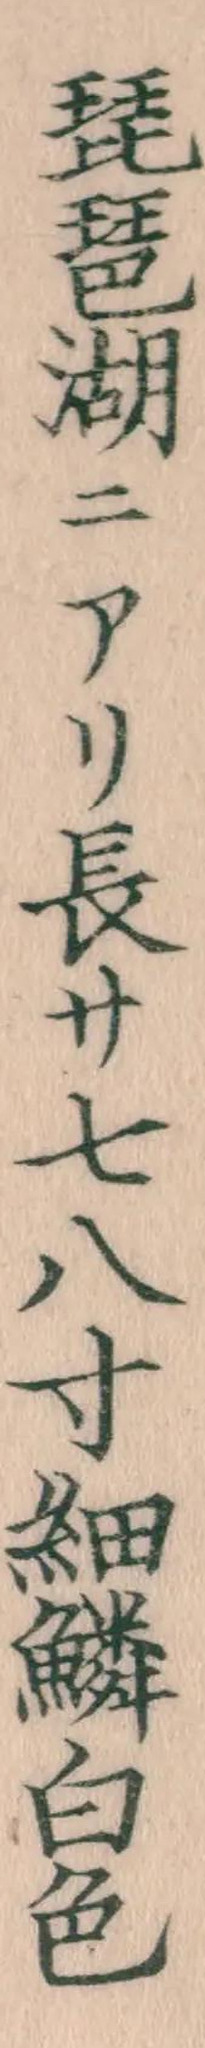琵琶湖ニアリ長サ七八寸細鱗白色
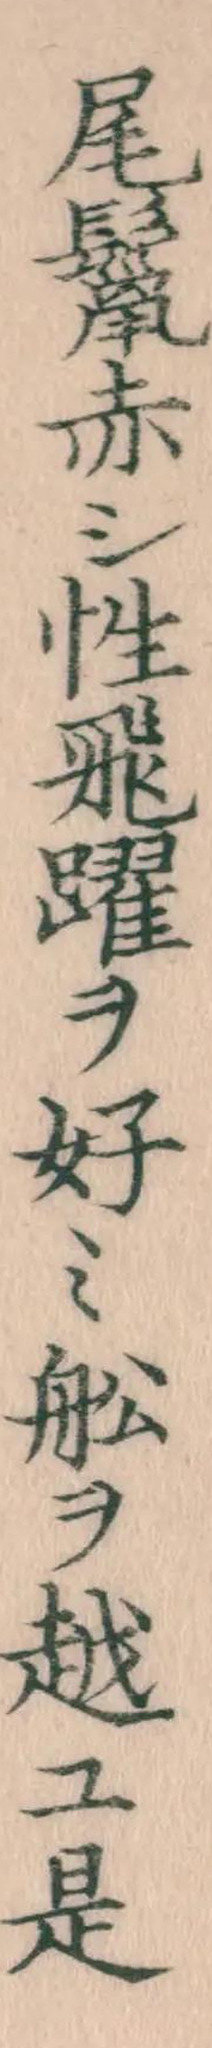尾鬣赤シ性飛躍ヲ好ミ船ヲ越ユ是
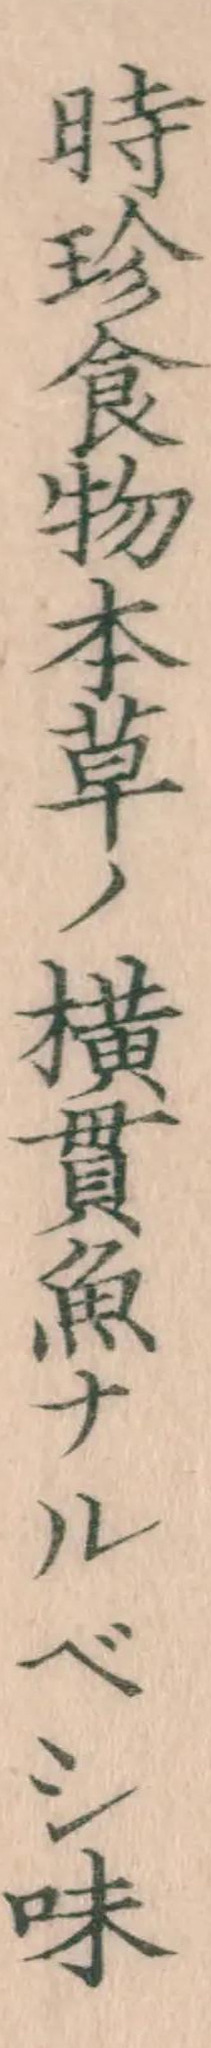時珍食物本草ノ横貫魚ナルベシ味
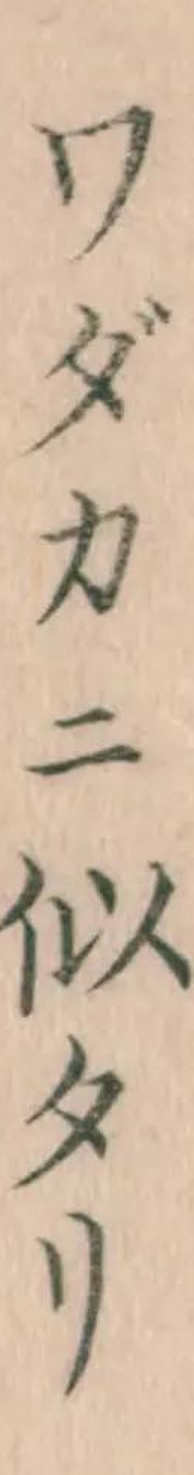ワダカニ似タリ

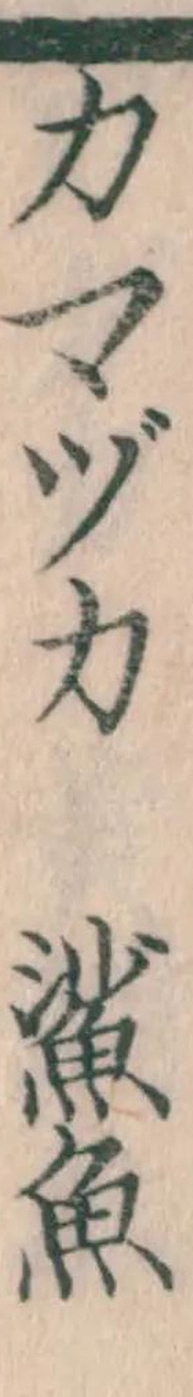カマヅカ鯊魚
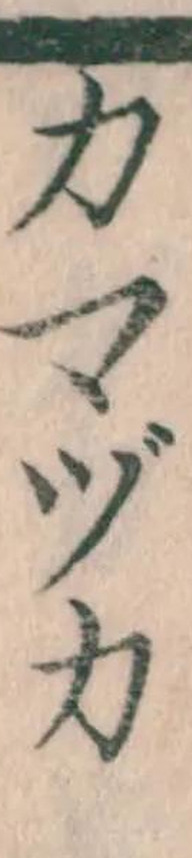カマヅカ
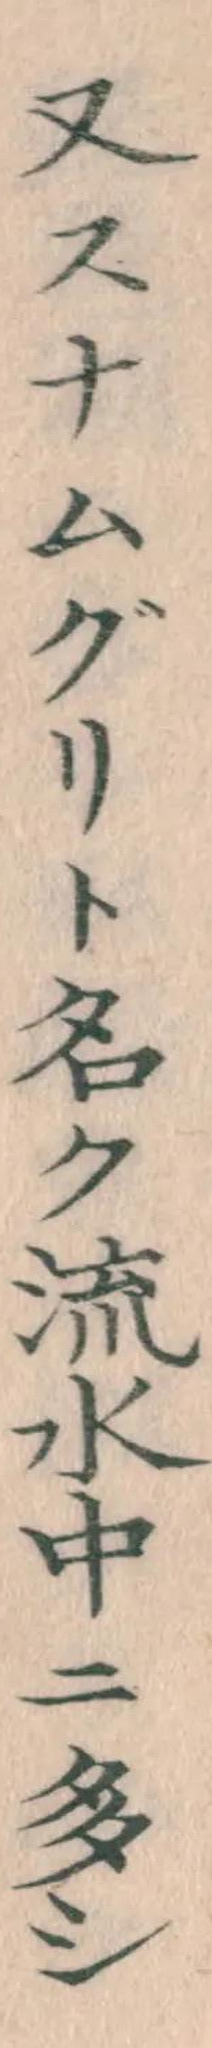又スナムグリト名ク流水中ニ多シ
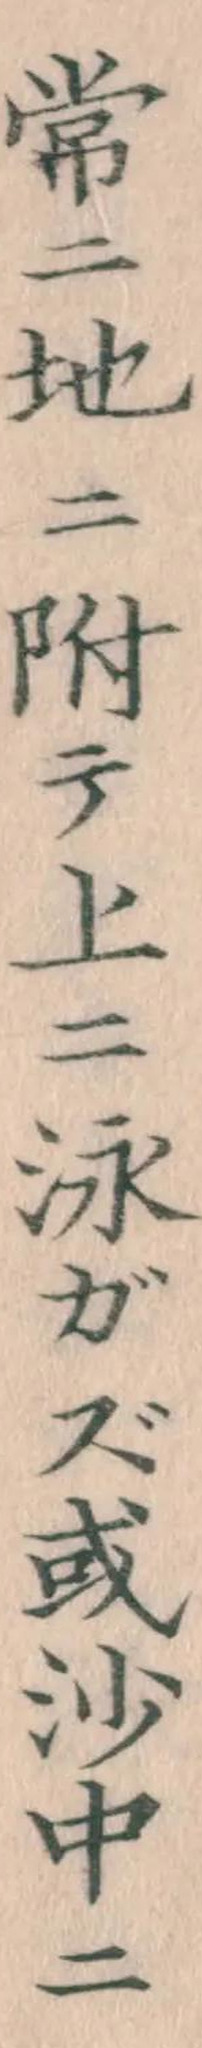常ニ地ニ附テ上ニ泳ガズ或沙中ニ
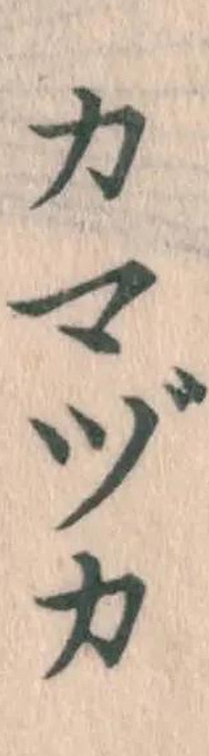カマヅカ
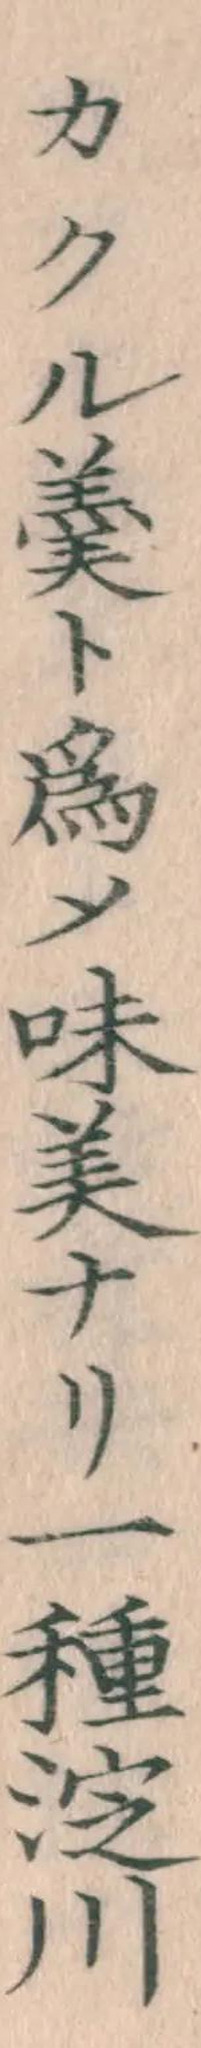カクル羹ト為シテ味美ナリ一種淀川
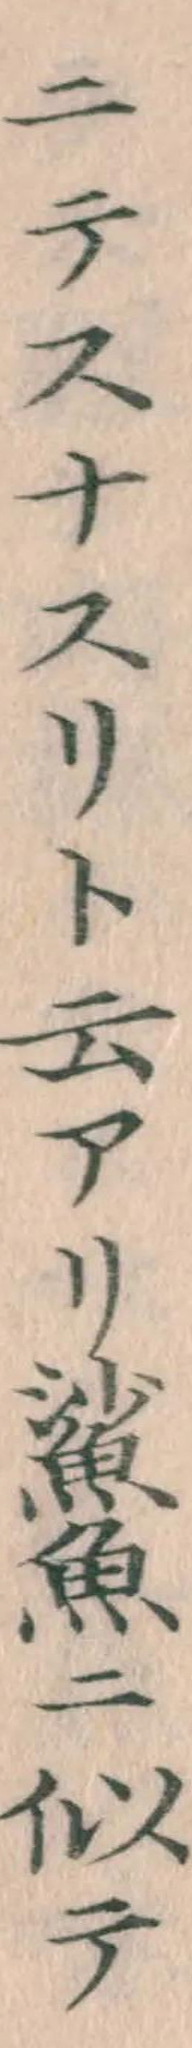ニテスナスリト云アリ鯊魚ニ似テ
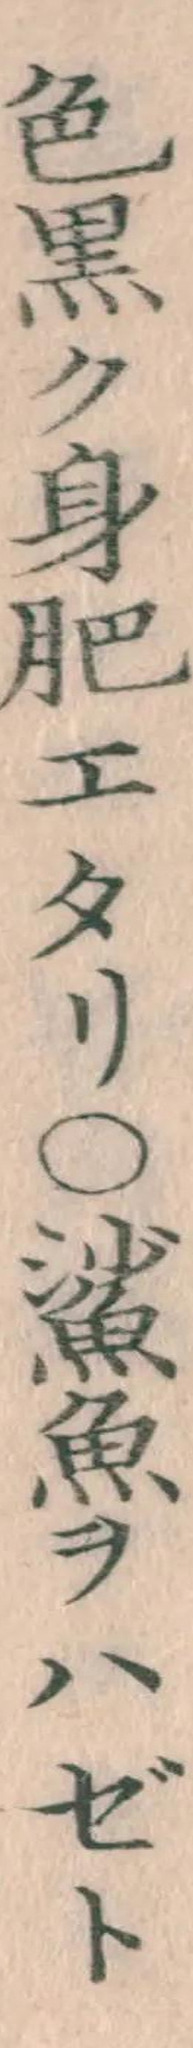色黒ク身肥エタリ〇鯊魚ヲハゼト
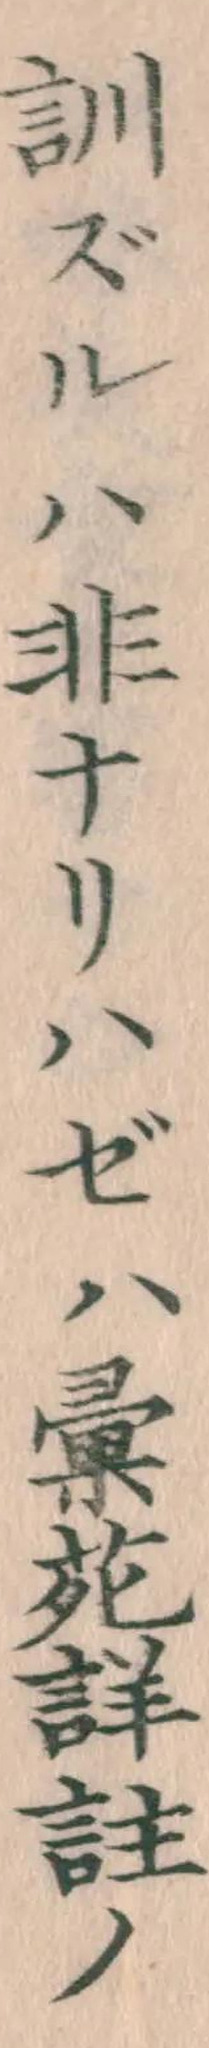訓ズルハ非ナリハゼハ彙苑詳註ノ
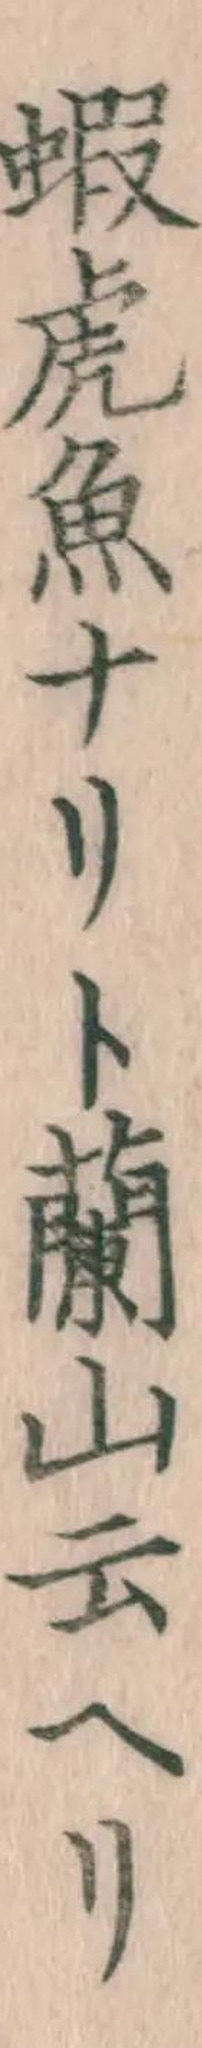蝦虎魚ナリト蘭山云ヘリ
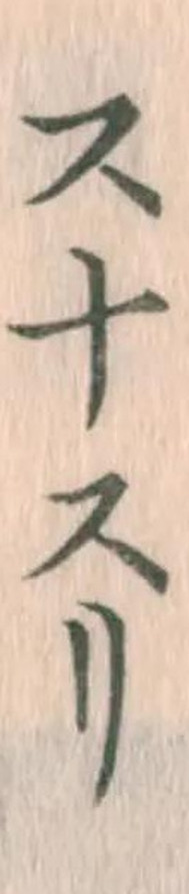スナスリ

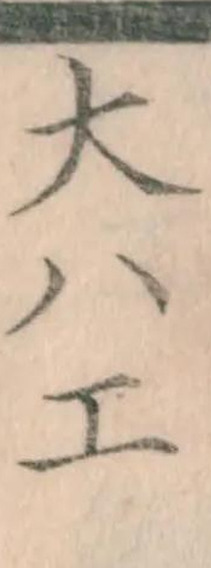大ハエ
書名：皇和魚譜 2巻
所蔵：国立国会図書館 National Diet Library, JAPAN
